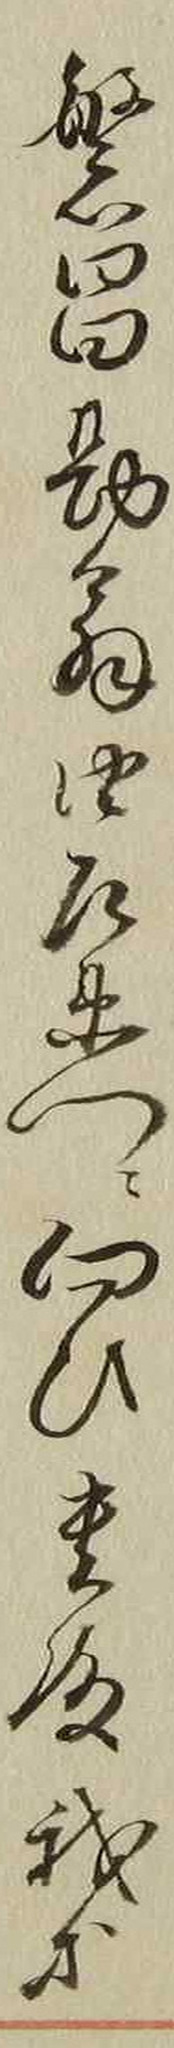繁昌勘解由左衛門ニ向ひ貴殿我等
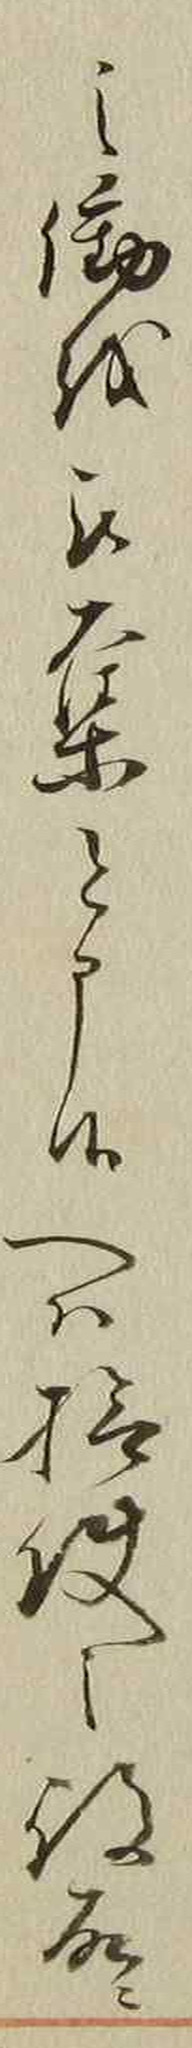之働を被と申候へハ検使之役故ニ
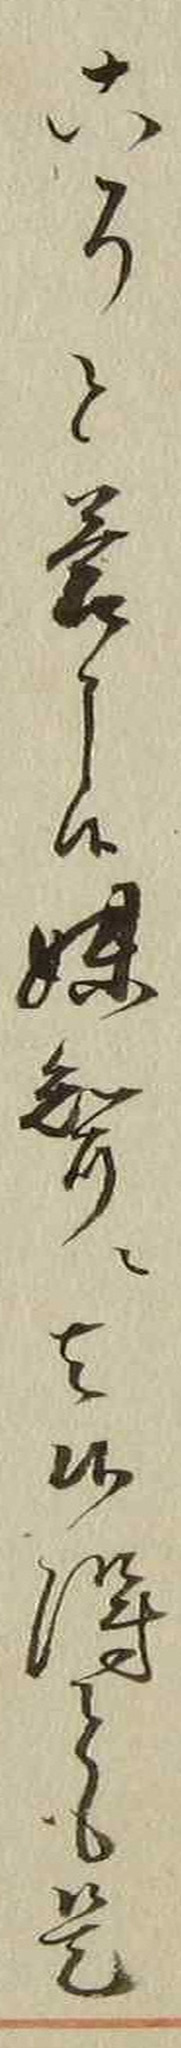こそと答申候妹婿ニ者候得とも是
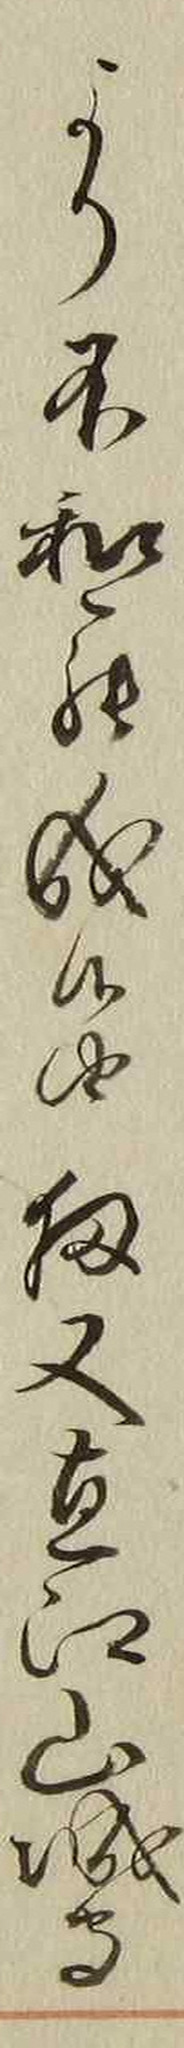より不和罷成候候由扨又直江山城守
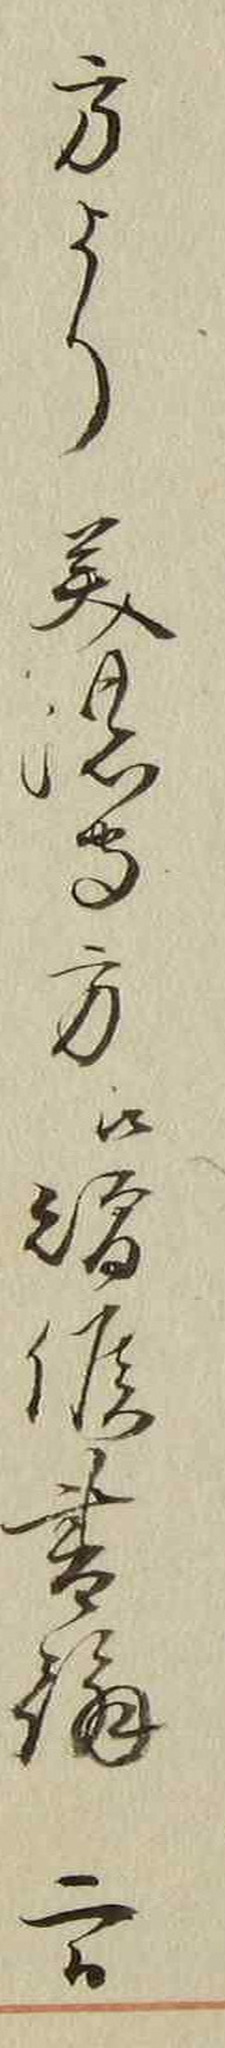方より美濃守方江贈候書翰二日
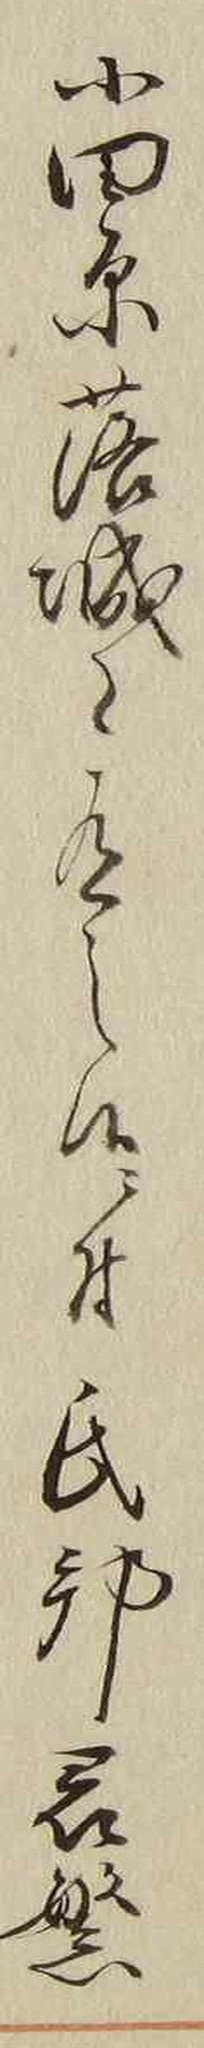小田原落城と有之候ニ付氏邦君繁
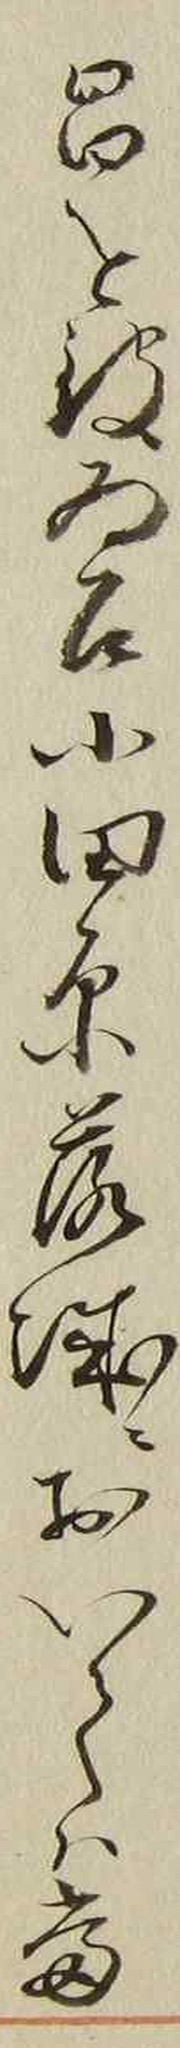昌を被為召小田原落城ニおいてハ当
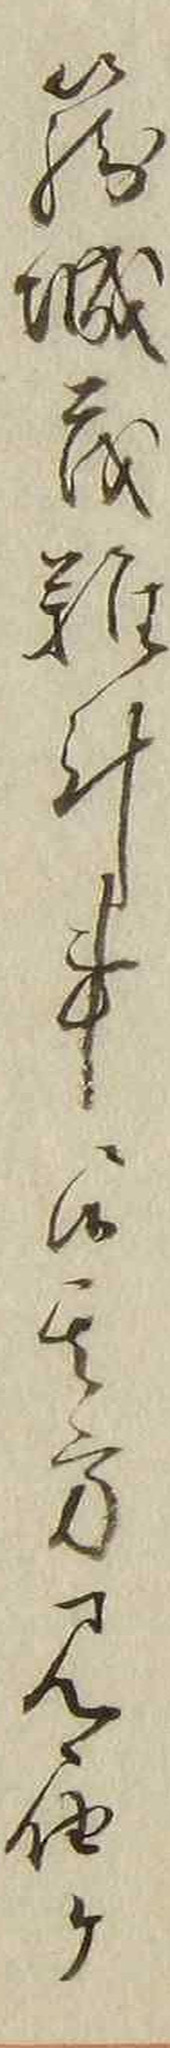籠城も難計事ニ候其方見届ケ
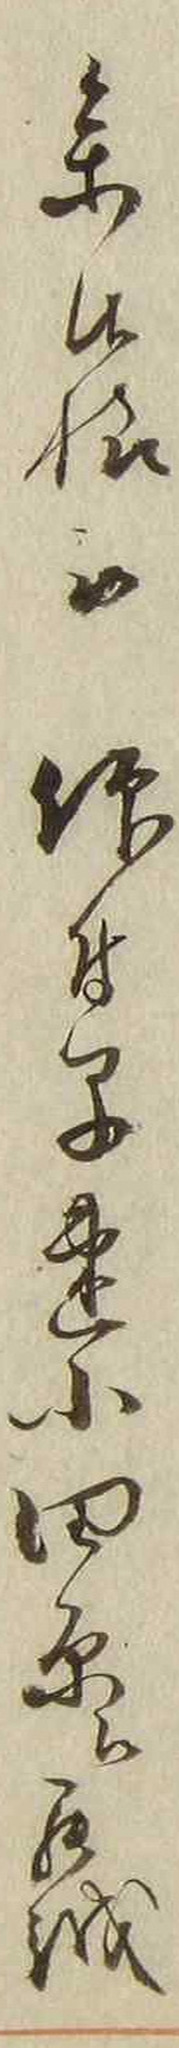参候様被仰付早速小田原江罷越

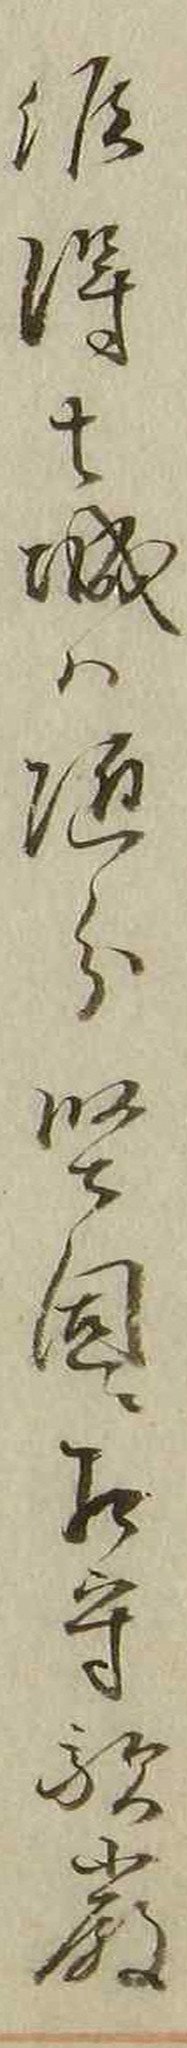候得者城ハ随分堅固ニ相守敵厳
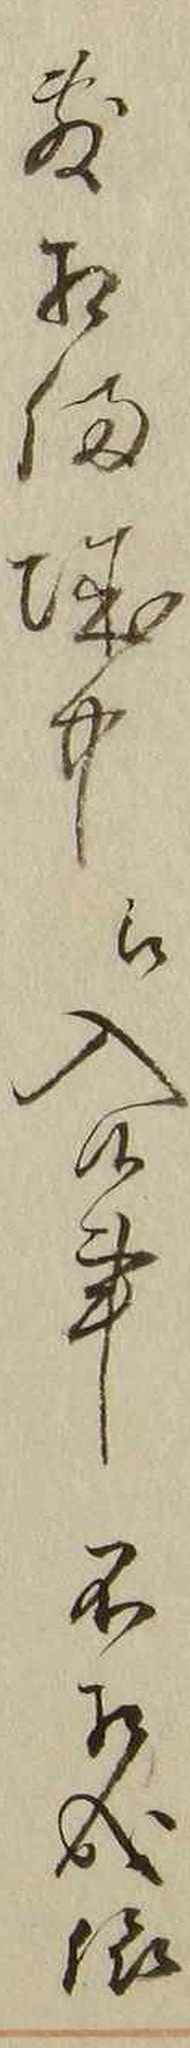敷相備城中江入候事不相成依
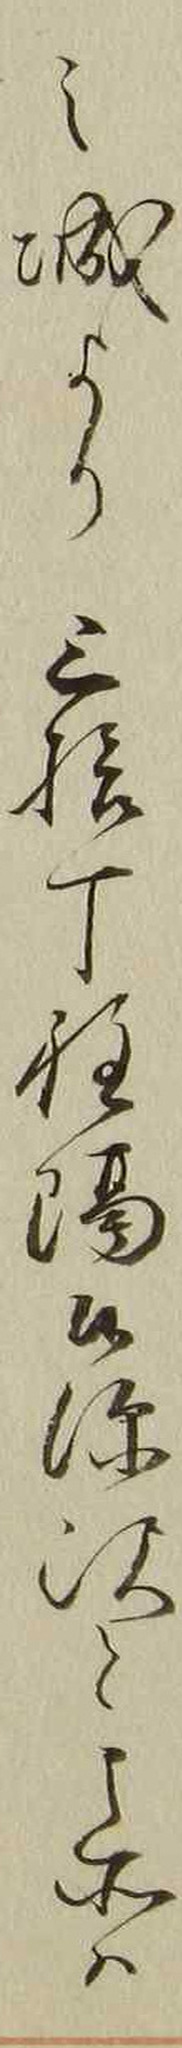之城より三拾丁程隔候深沢と申所ハ
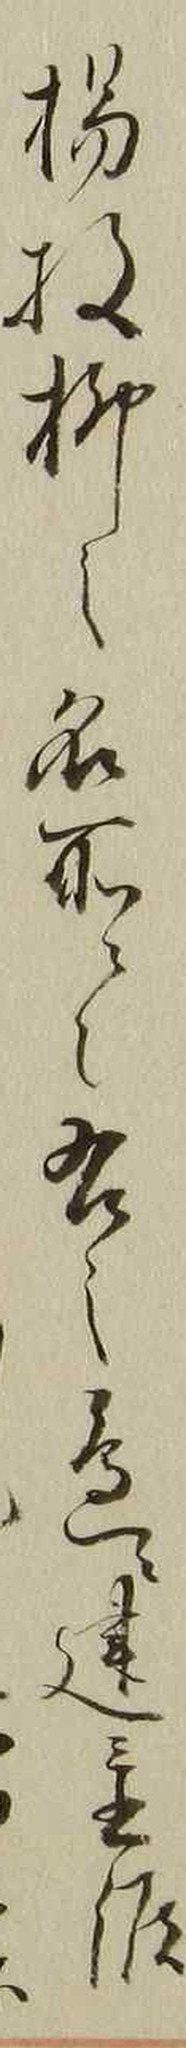楊枝柳之名所ニて右之辺ニ建置候
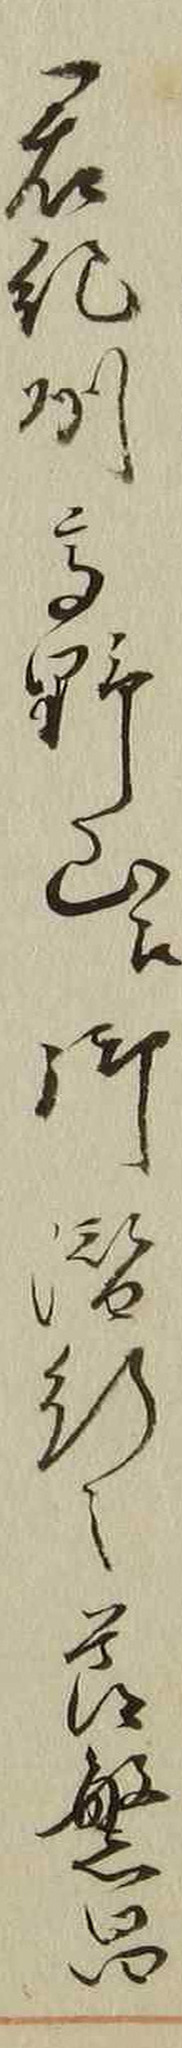君紀州高野山江御潜行之節繁昌
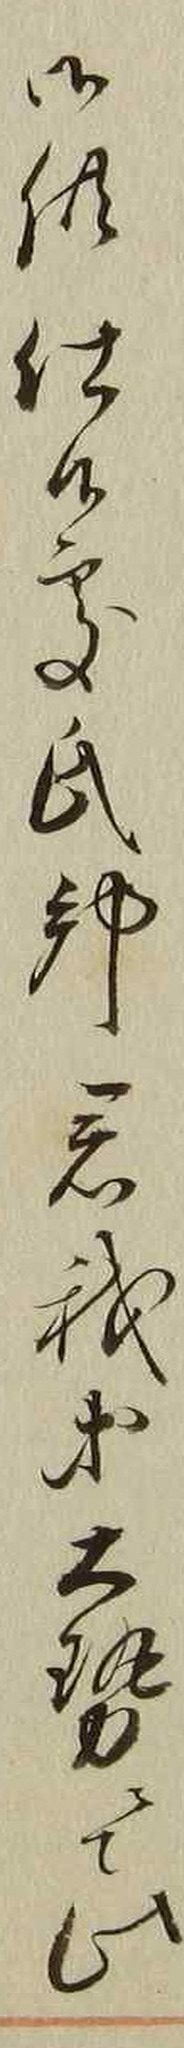御供仕候処氏邦君我等大勢ニて此
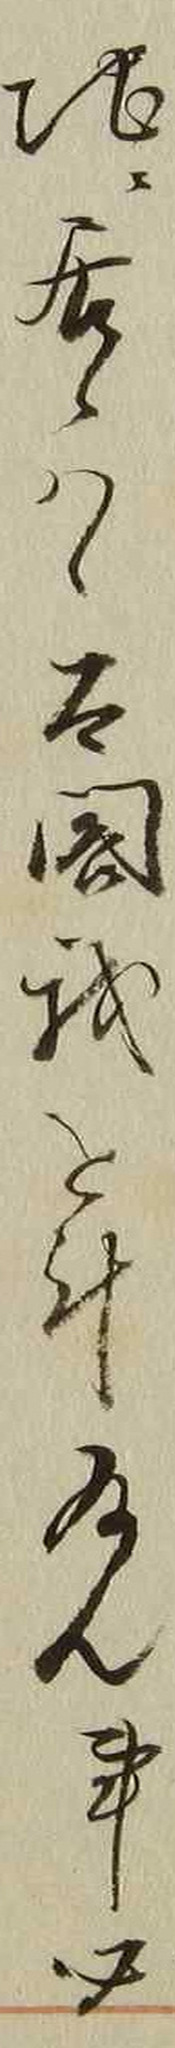地ニ居候ハヽ太閤我を計給ん事必
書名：諸士系譜　巻之122　よ之部5
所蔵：会津若松市立会津図書館
